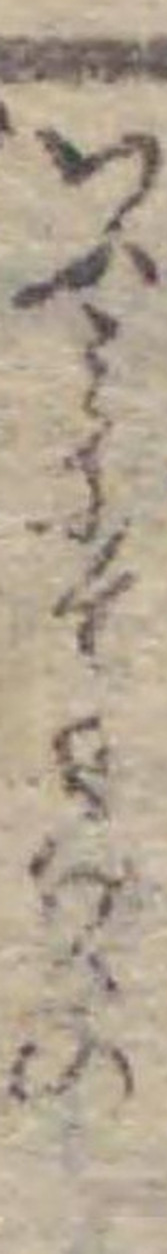いふみにてけの
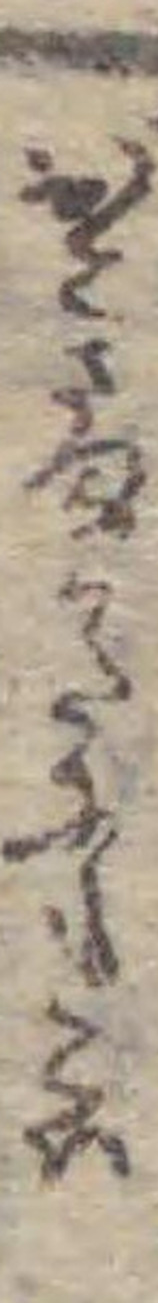おこさまかたにもこは
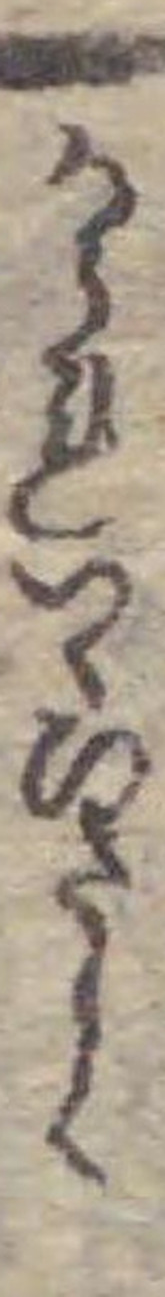かられいくひさしく
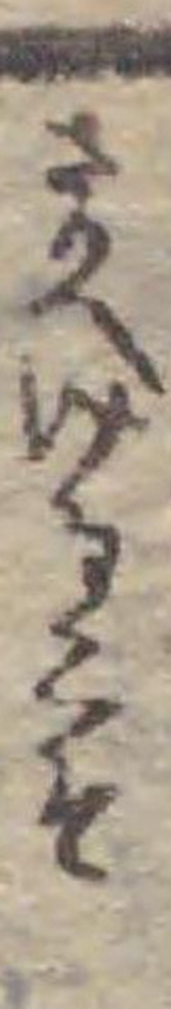さかへけるこそ
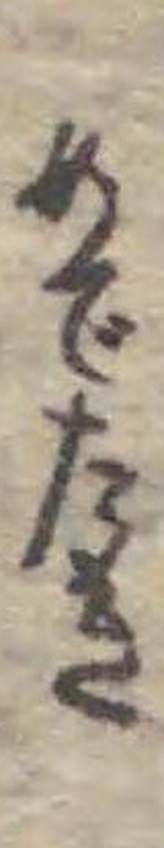めでたき
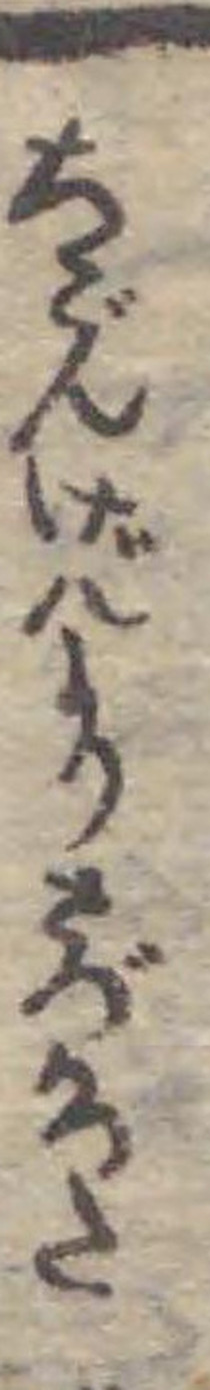大ごんげんよりさづかつた
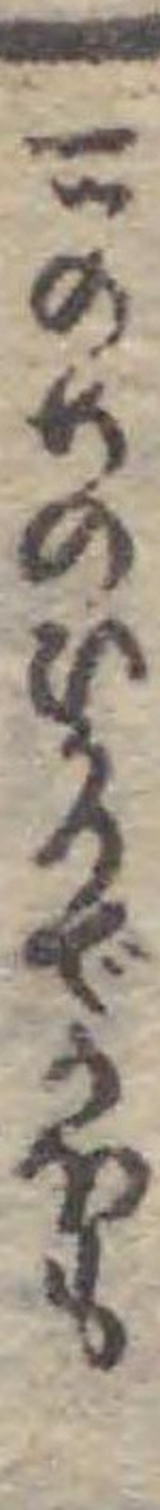このめのひかりでかほも
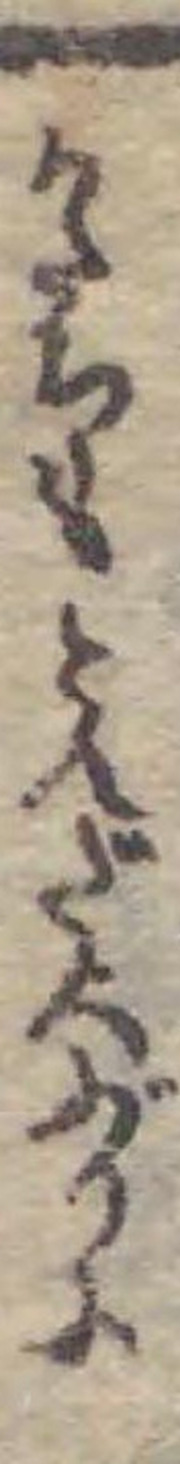かたちもとんだ大ぶりに
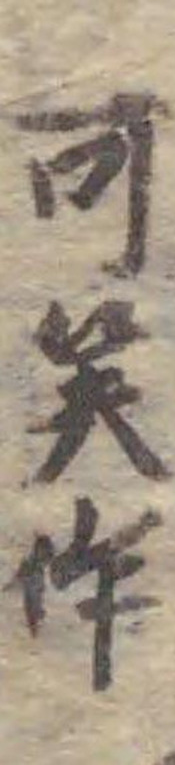可笑作
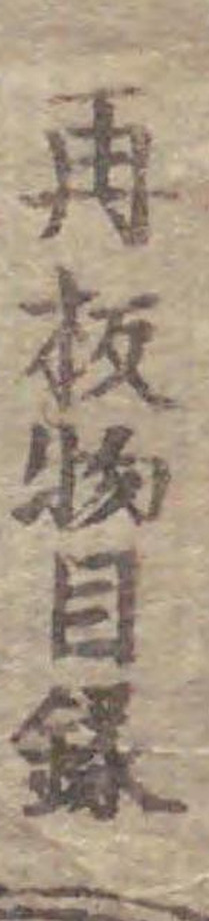再板物目録
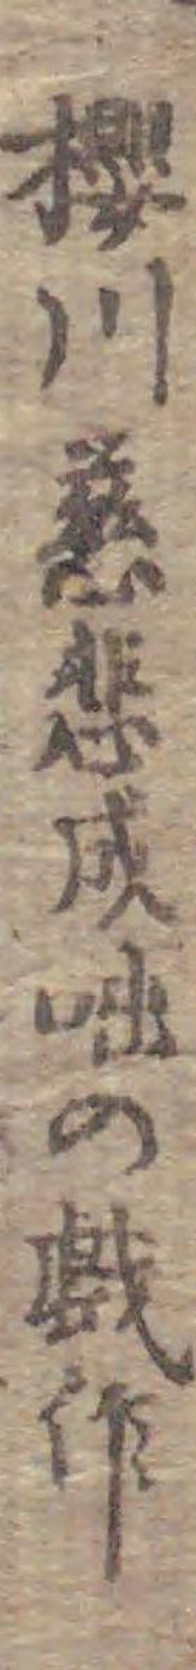桜川慈悲成咄の戯作
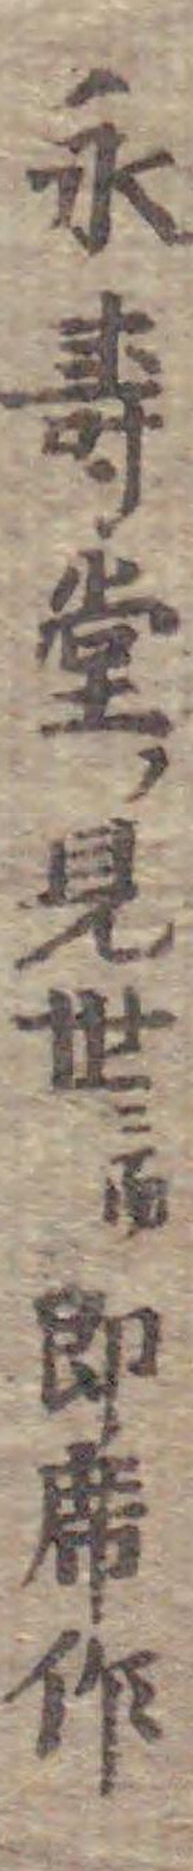永寿堂の見世に而即席作
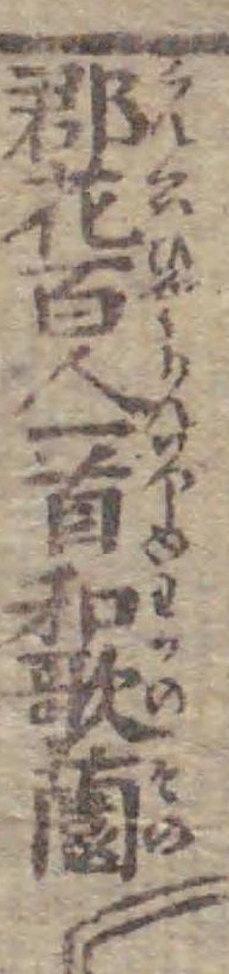郡花百人一首和歌薗
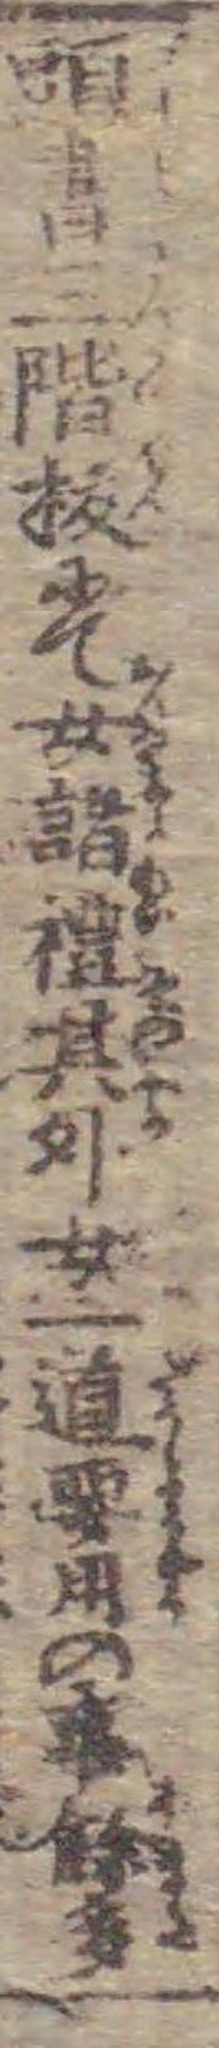頭書三階板にて女諸礼其外女一道要用の事餘多
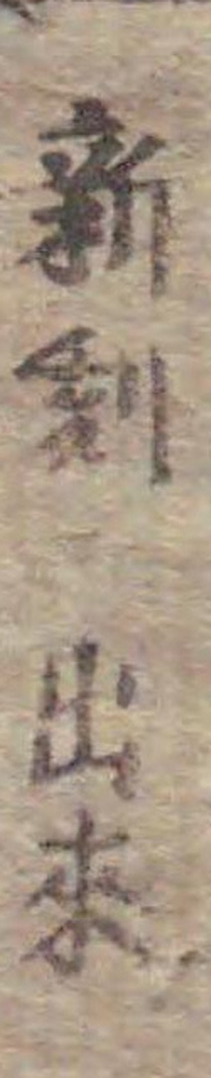新刻出来
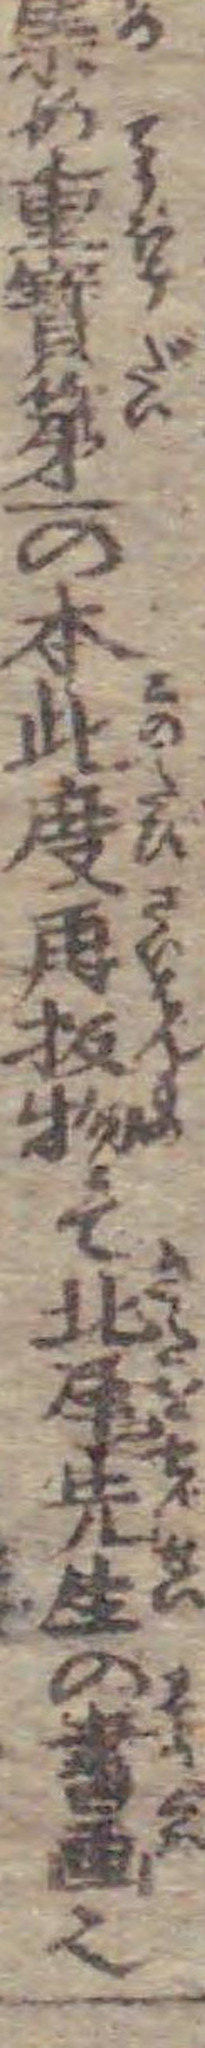集め重宝第一の本此度再板物にて北尾先生の書画也
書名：[化物一代記] : 5巻
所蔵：国立国会図書館 National Diet Library, JAPAN
